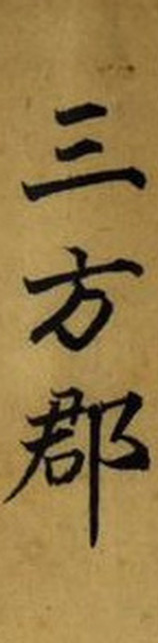三方郡
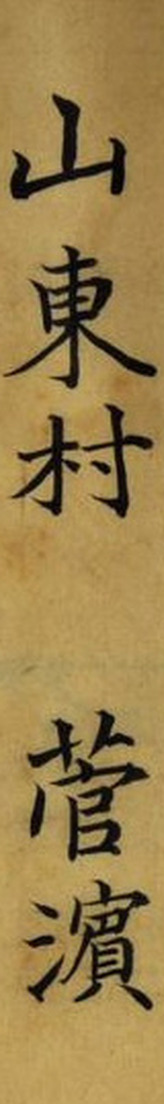山東村菅浜

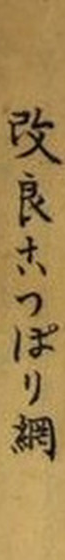改良こつぽり網

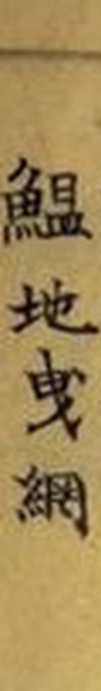鰛地曳網

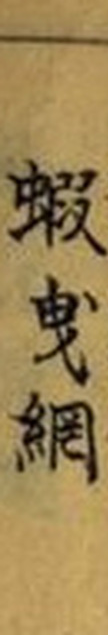蝦曳網

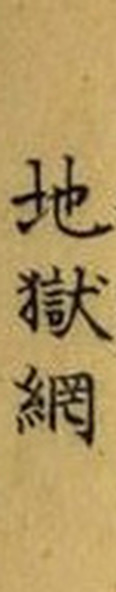地獄網

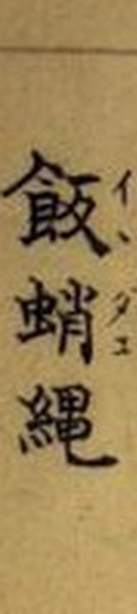飯蛸縄

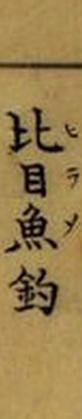比目魚釣

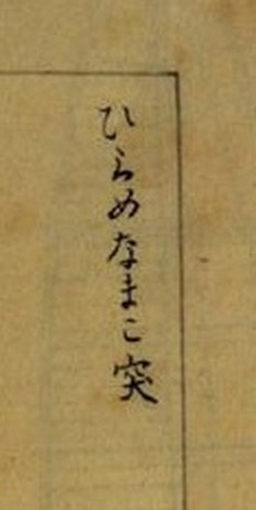ひらめなまこ突

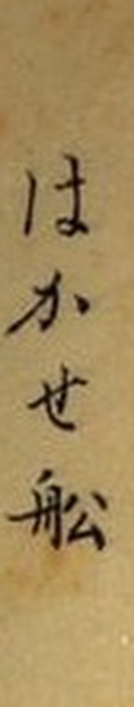はかせ船

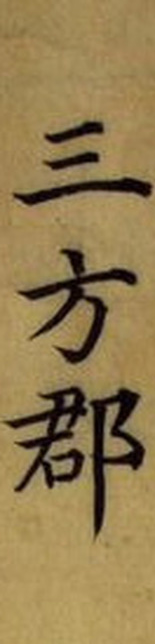三方郡
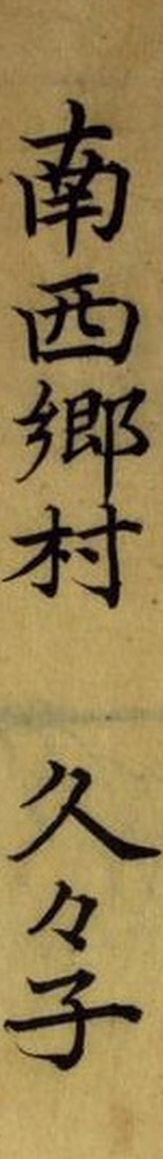南西郷村久々子

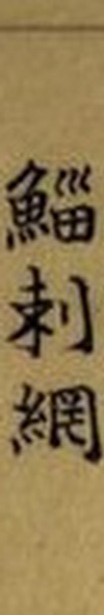鯔刺網

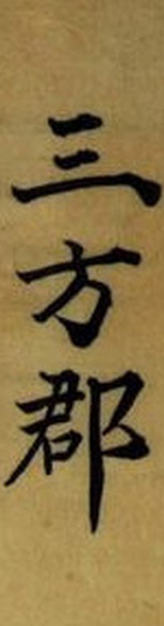三方郡
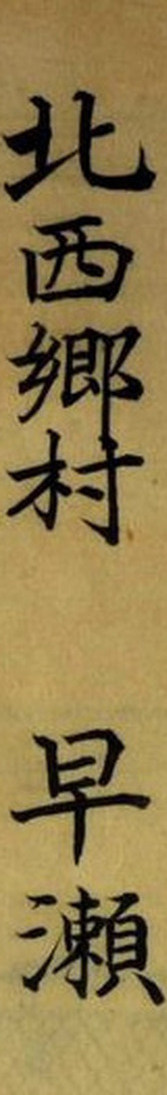北西郷村早瀬

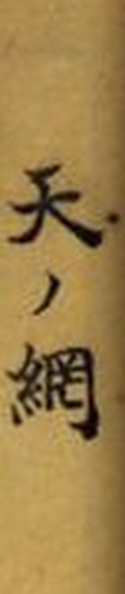天ノ網
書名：漁具図 若狭海ノ部[画像あり]
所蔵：福井県文書館 Fukui Prefectural Archives
